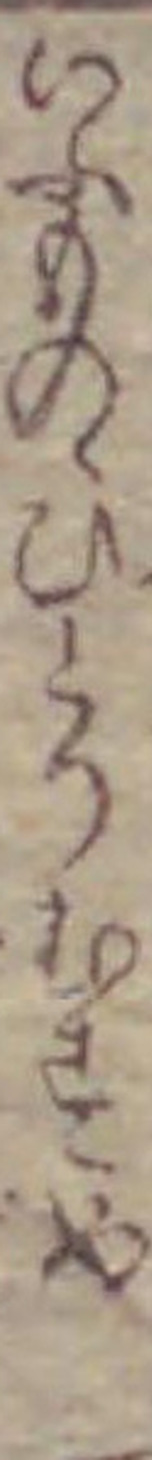いふものゝひとりむすめ

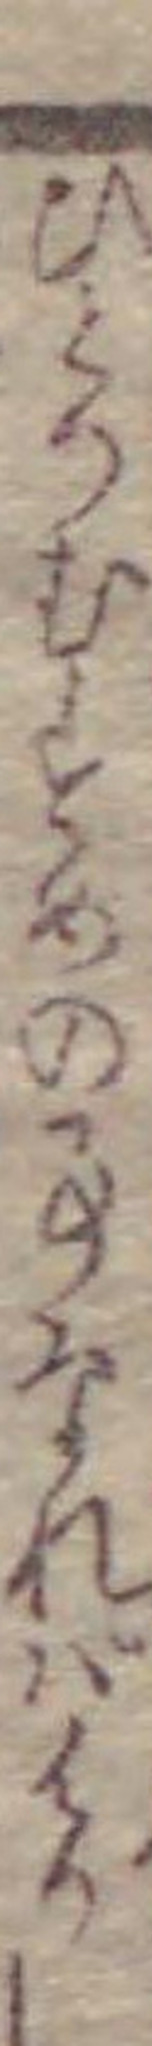ひとりむすめの事なればはり
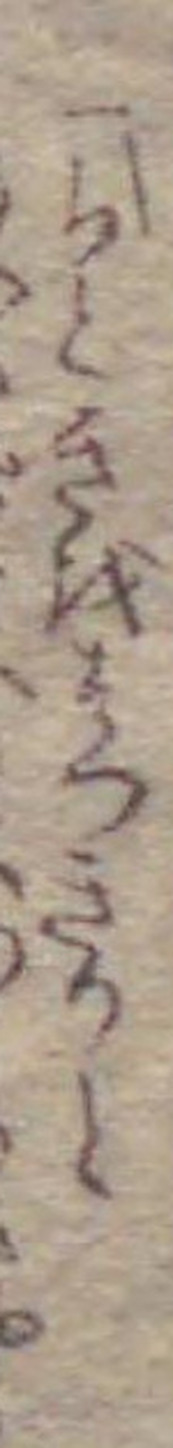〽ちときをはつきりと
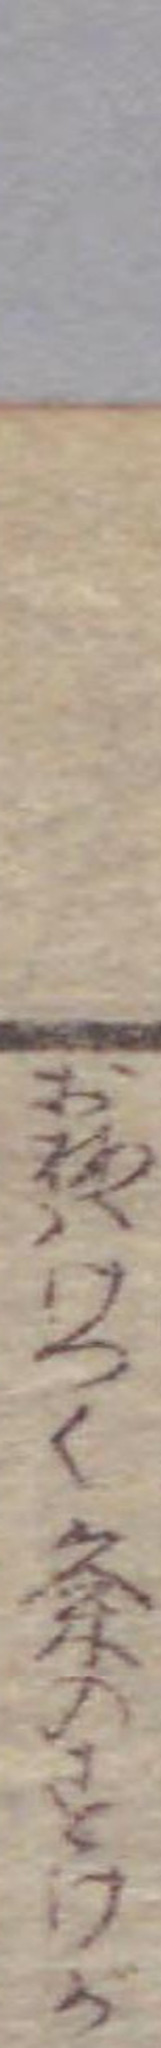お梅はけつく久米のすけが
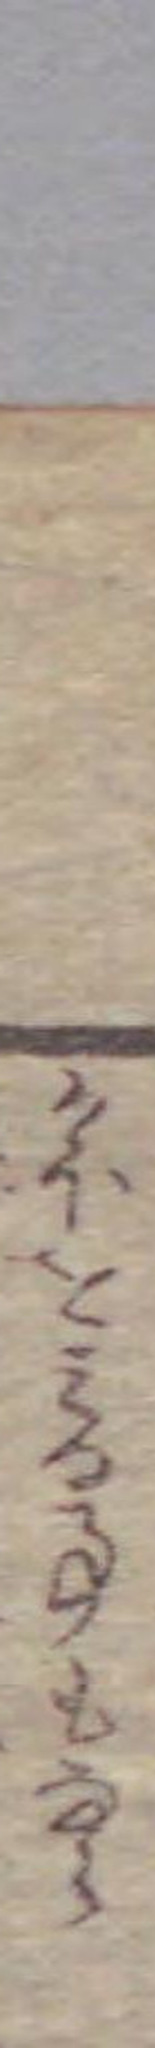かほをみる事もなら
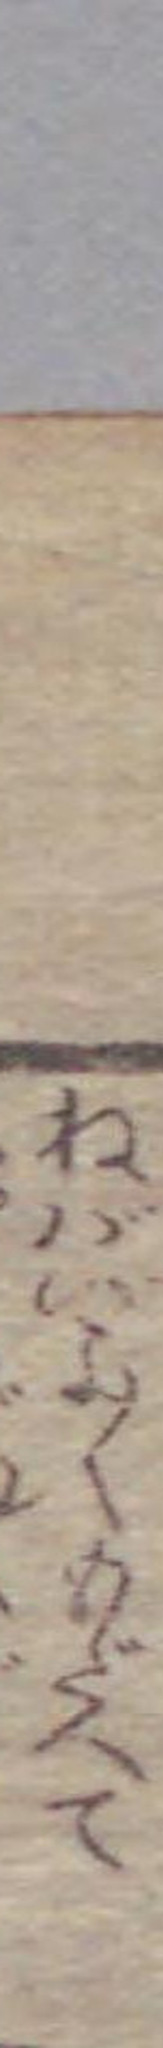ねばいよ〳〵もだへて
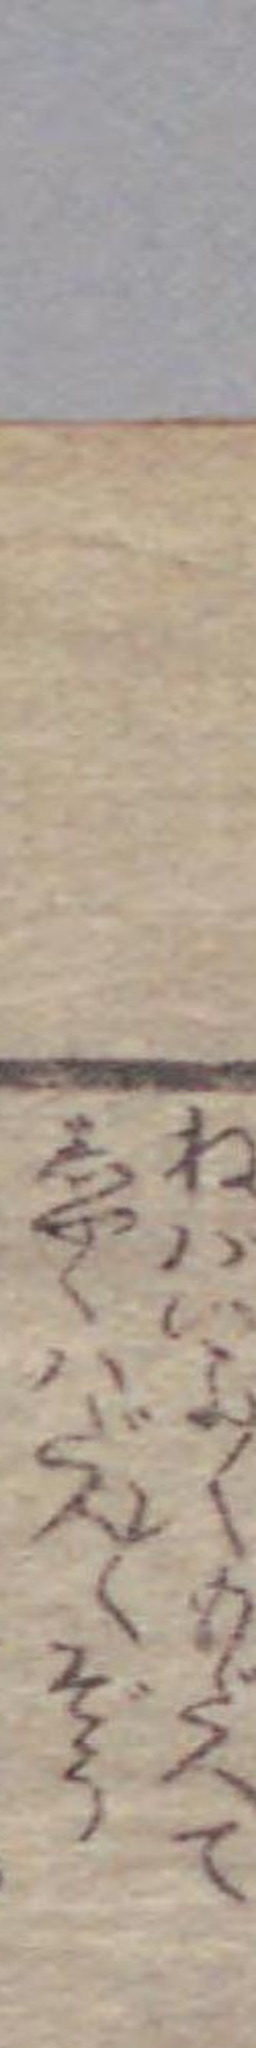しやくはだん〳〵ぞう
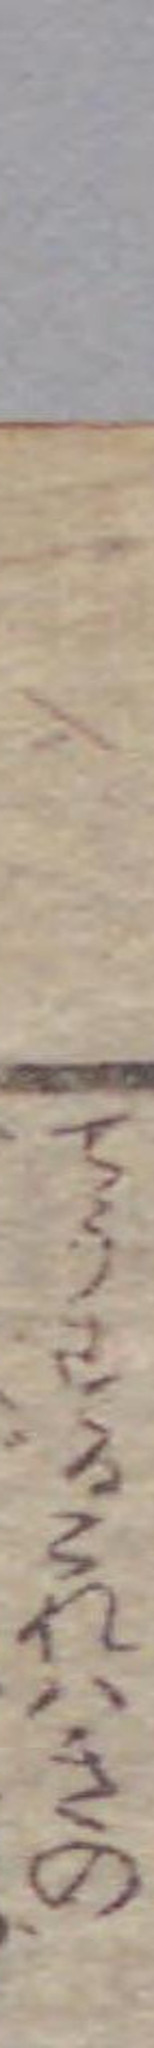てうするこれはきの
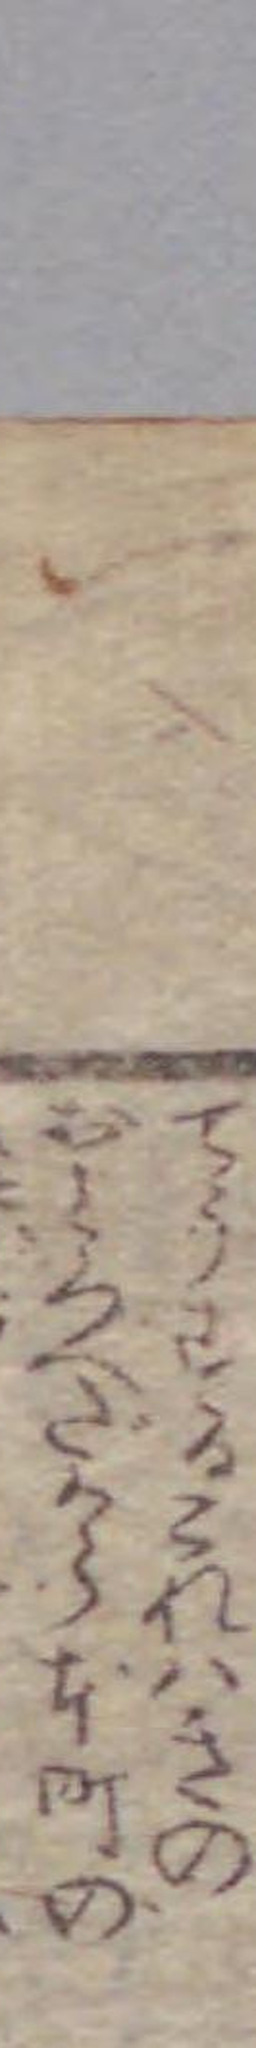おとろへだから本町の
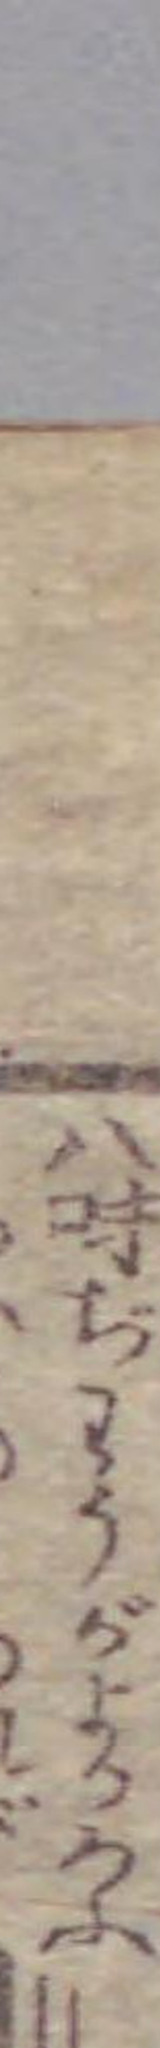八味ぢわうがよかろふ
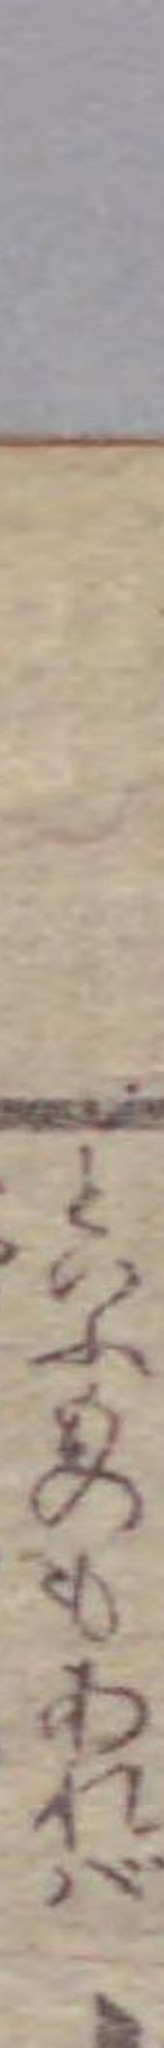といふものもあれば
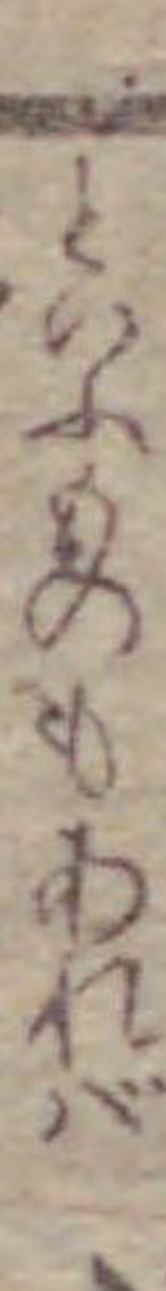といふものもあれば
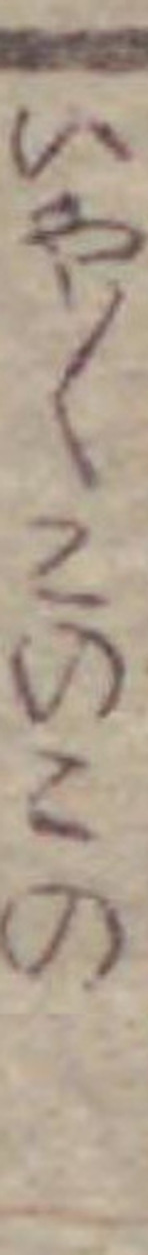いや〳〵このこの
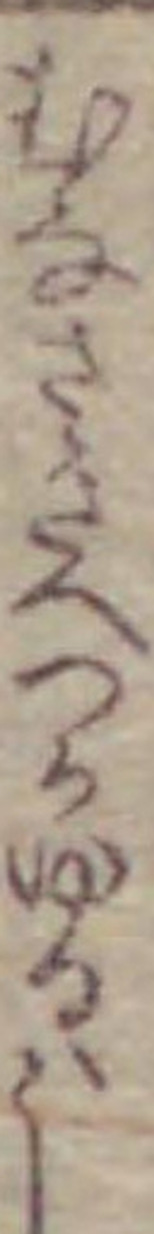むなさきへつかゆるは
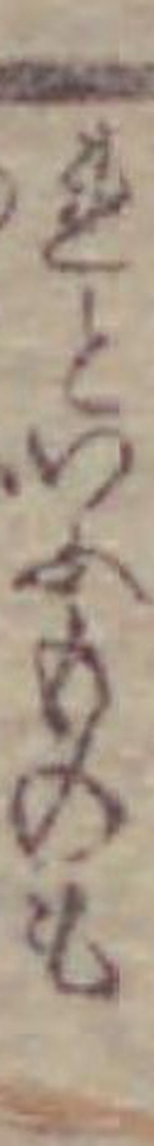れといふものも
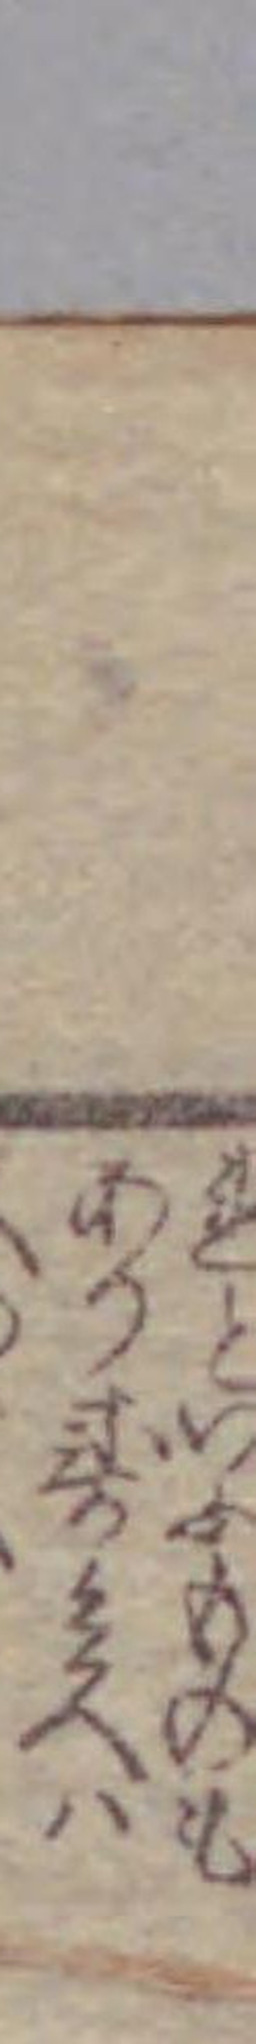あり寿兵へは
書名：鼻下長生薬 : 3巻
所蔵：国立国会図書館 National Diet Library, JAPAN
